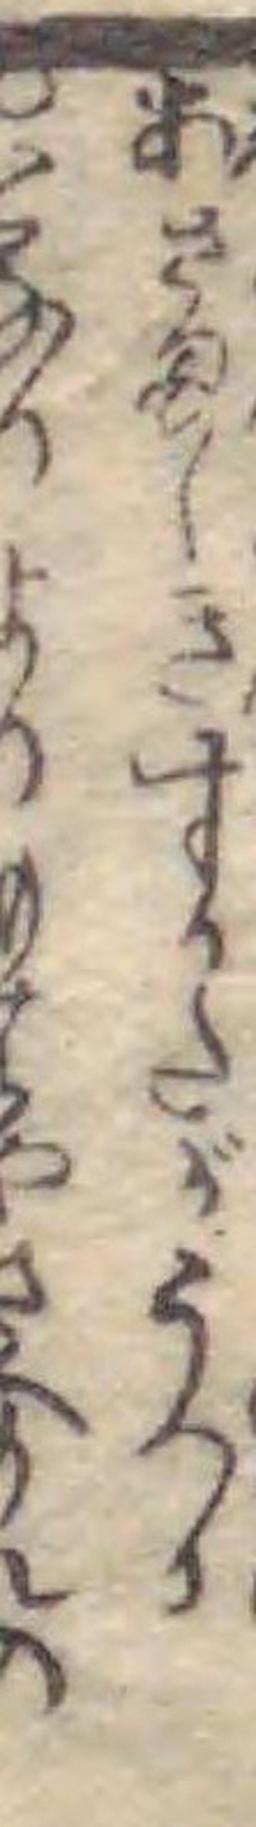○となりよりもはやさへもんの
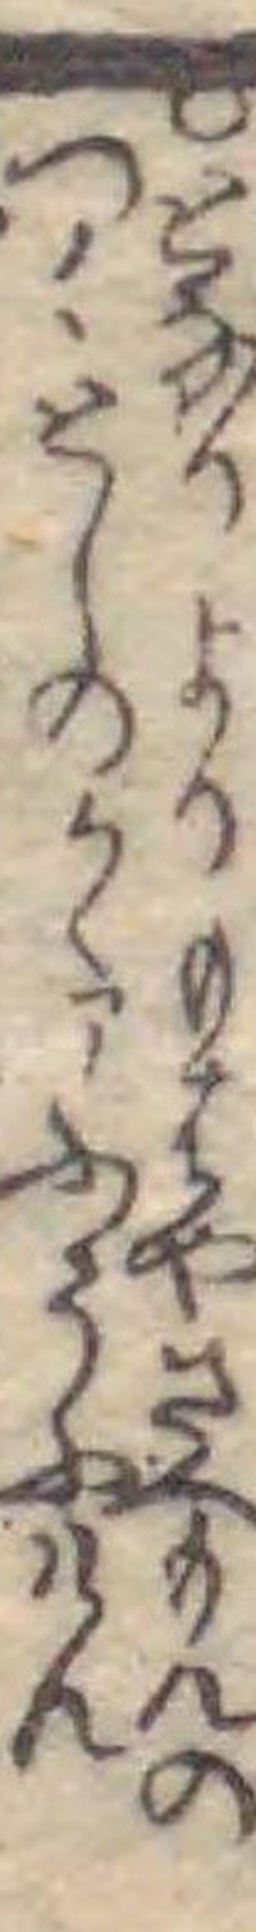つくとしのかゝァふうふけん
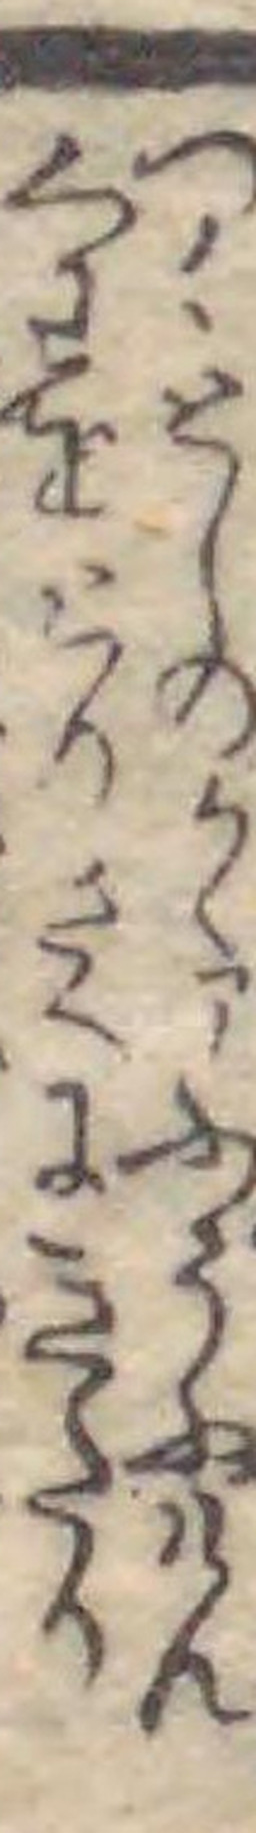くわをとりさへにきたり
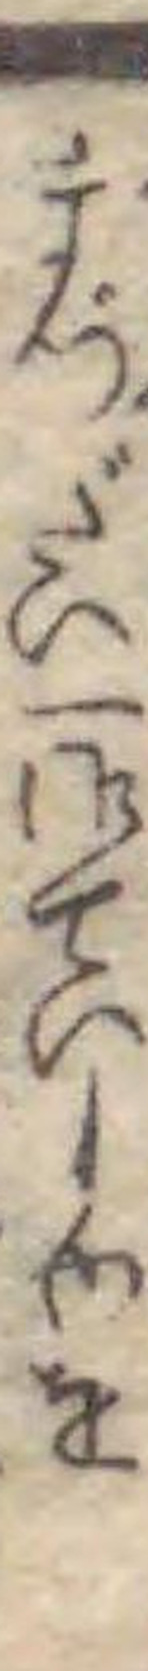まづだい一御ていしゆを
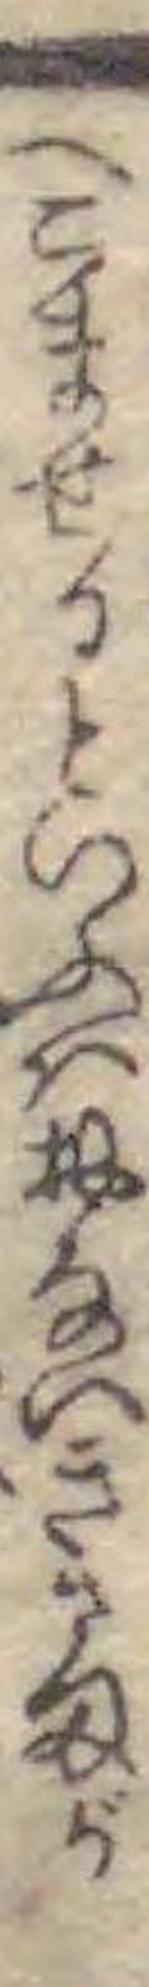へこませるといふはおないきさまが
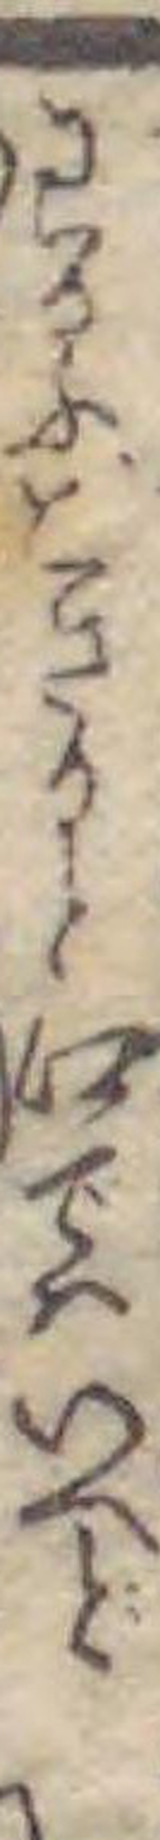わるふござると口ではいへど
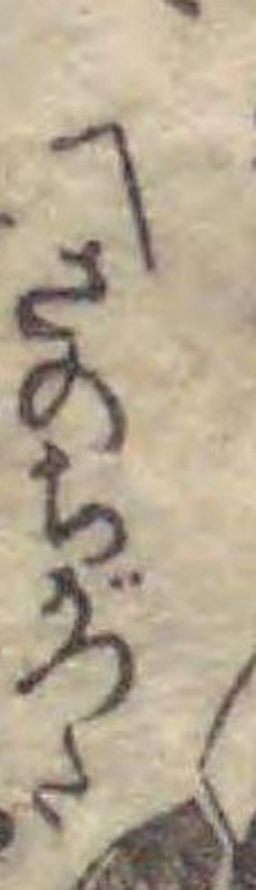〽きのちがつた
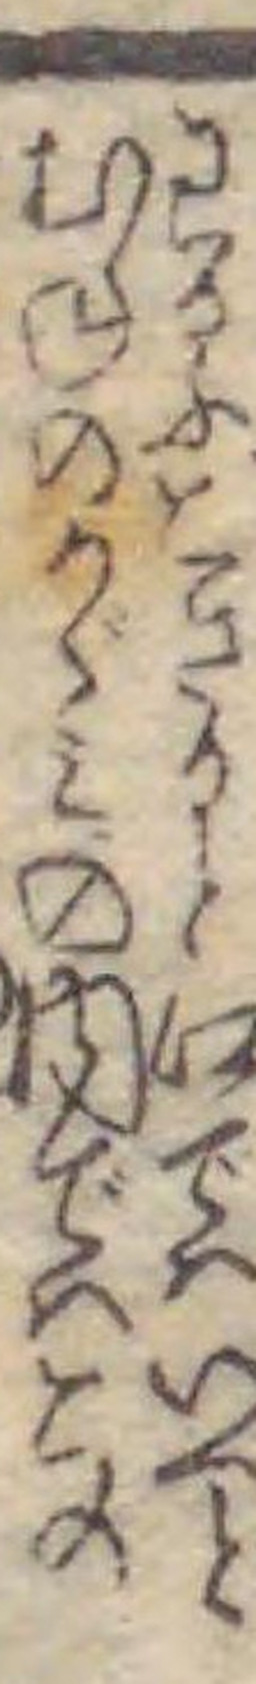むねのかゞみの内ではこの
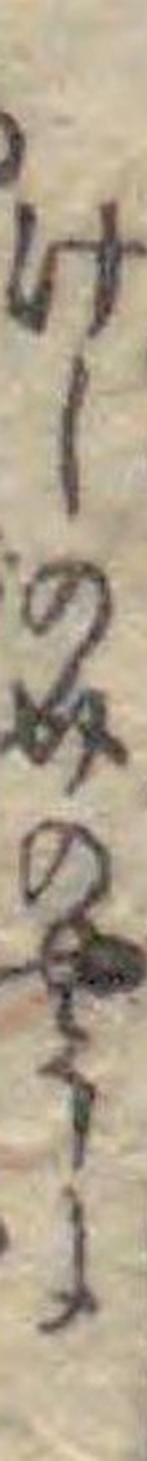けしの介のやうに
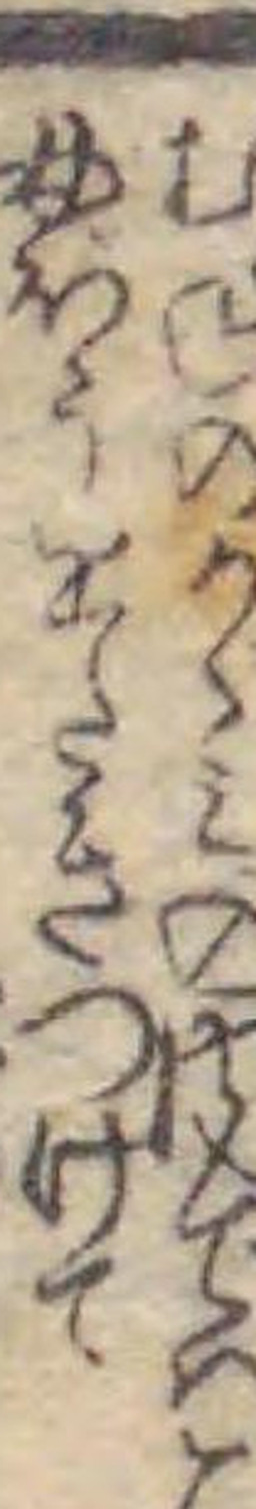女ぼうをたきつけて
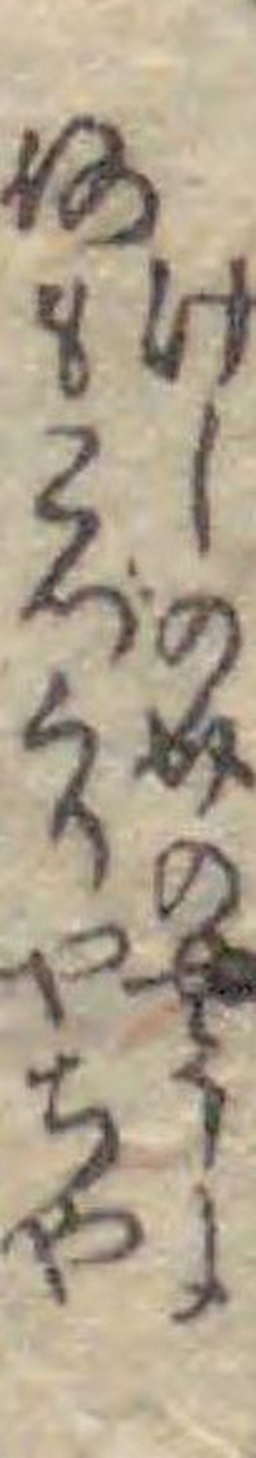何もとつくりやちや
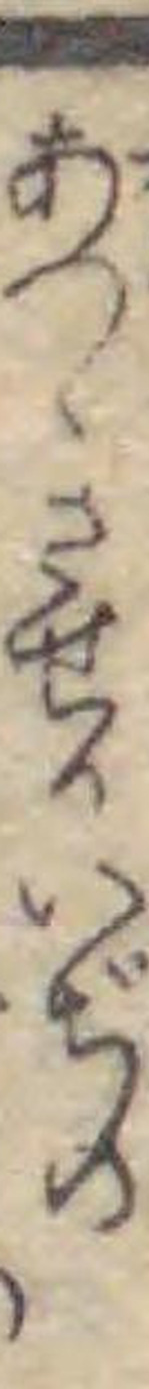あつくさせるいぢの
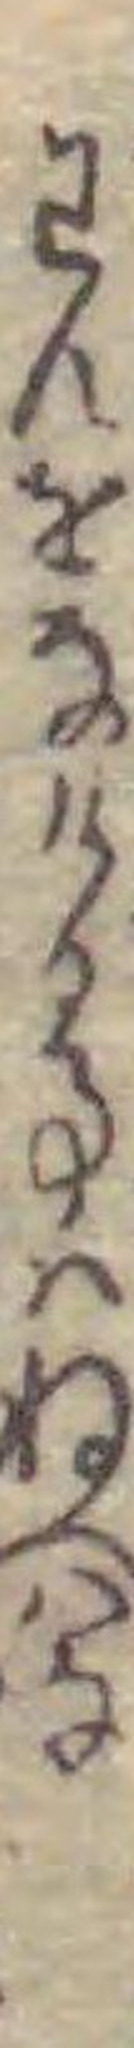わんをなける事はねへはな
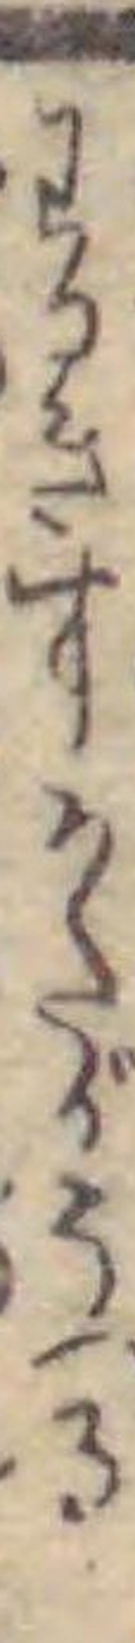わるきすかたがうつる
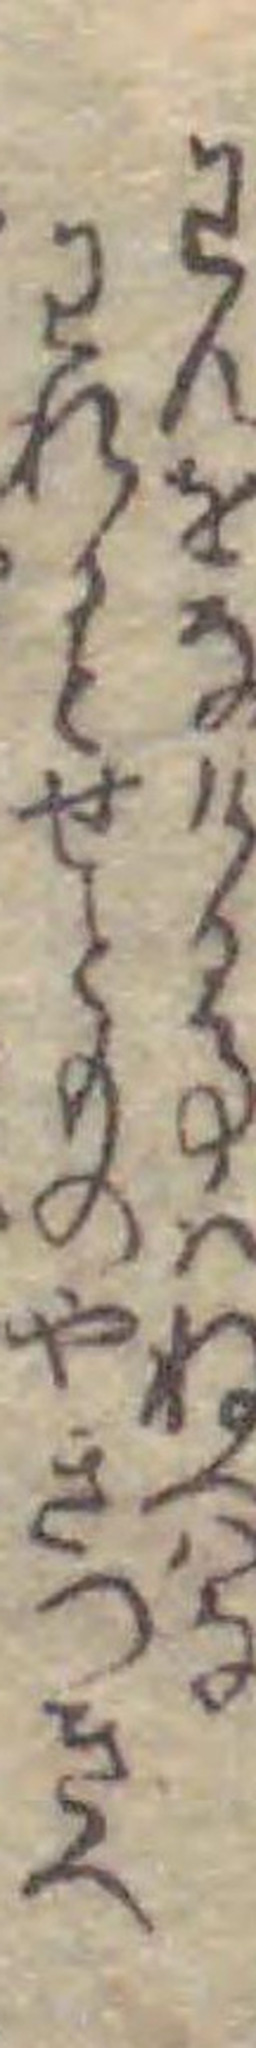われるとせとものやきつきへ
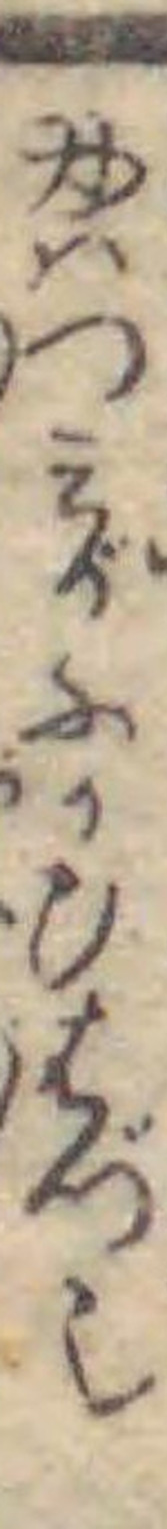女はつみがふかひはづ也
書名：人心鏡写絵 : 3巻
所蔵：国立国会図書館 National Diet Library, JAPAN
